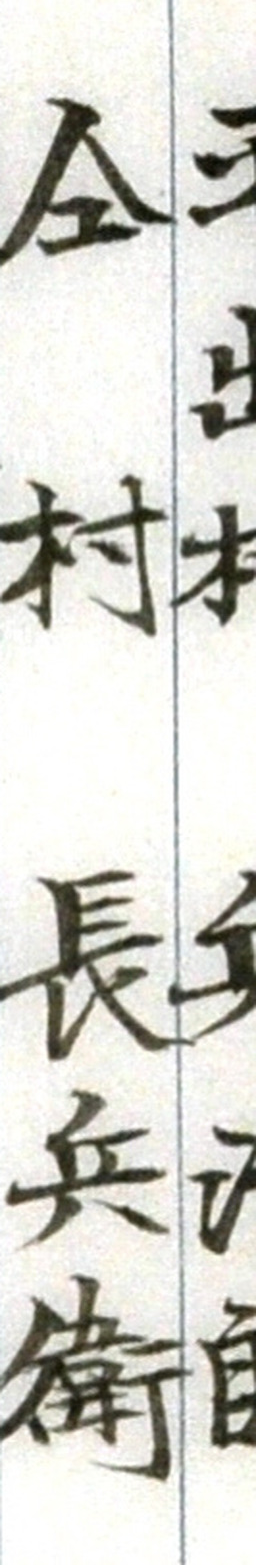同村長兵衛
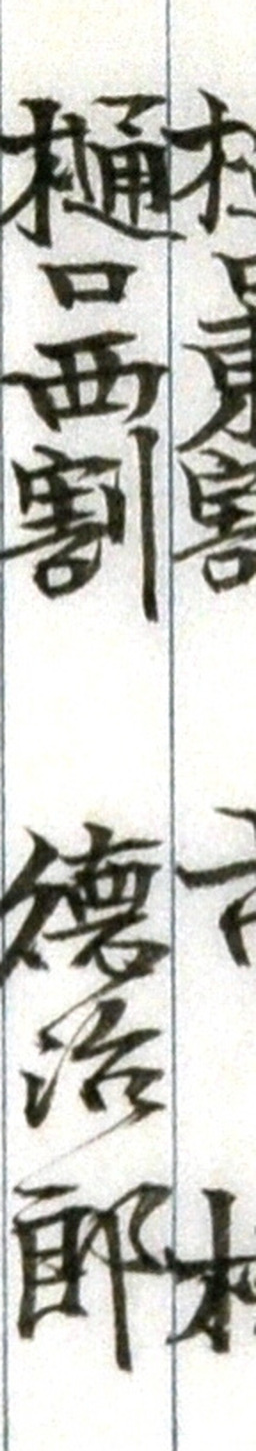樋口西割徳治郎
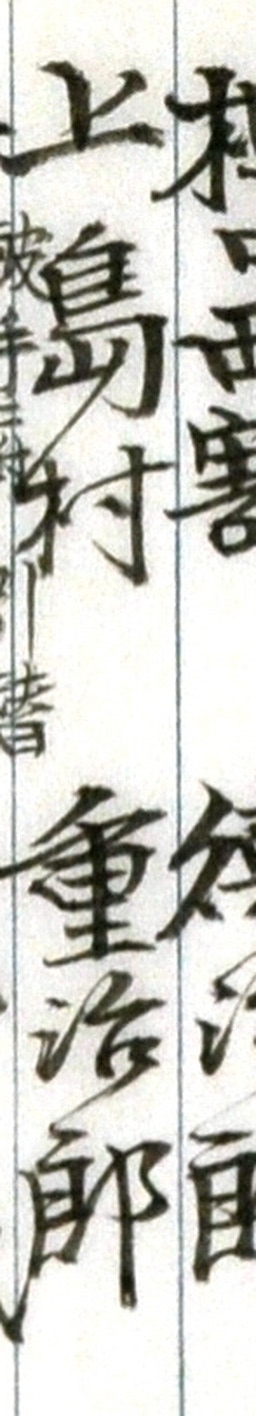上島村重治郎
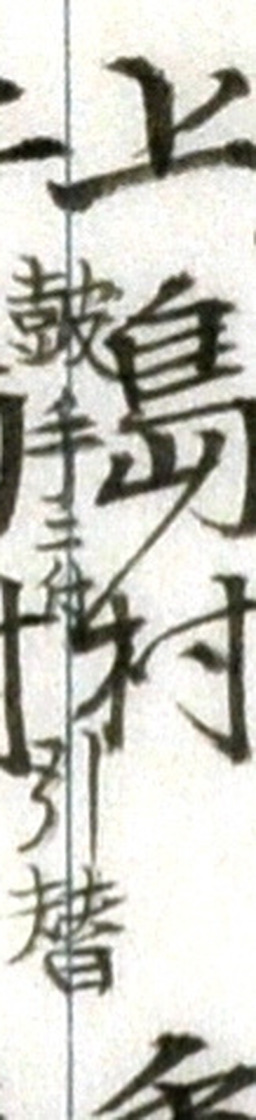皷手ニ付引替
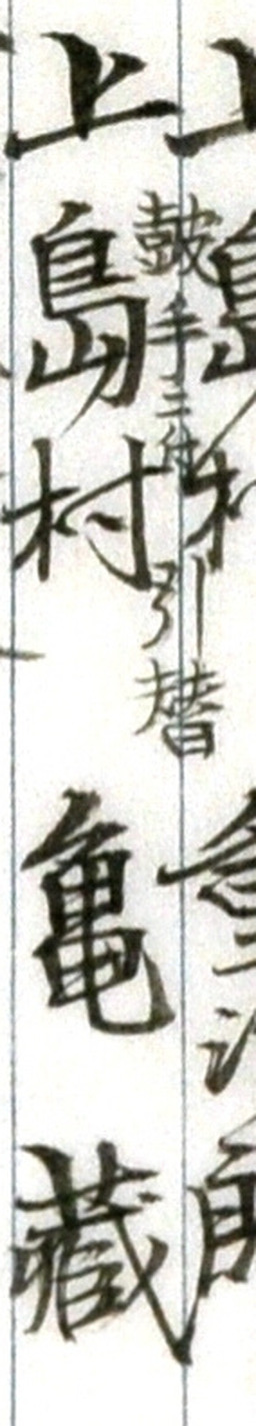上島村亀蔵
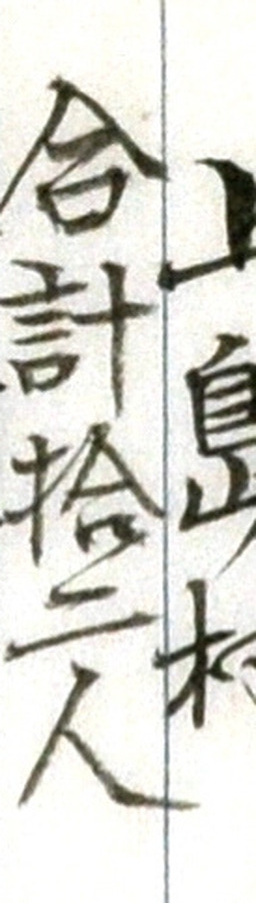合計拾二人
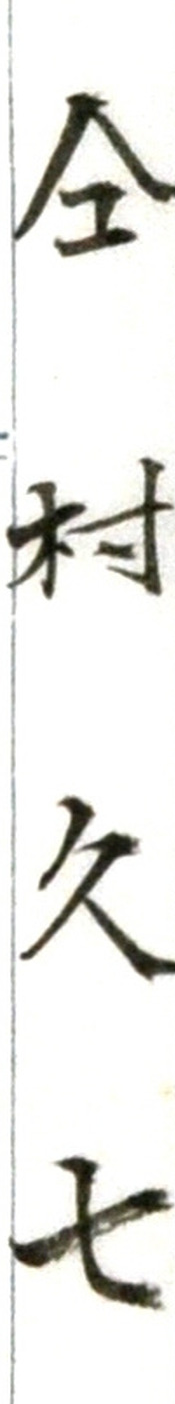同村久七

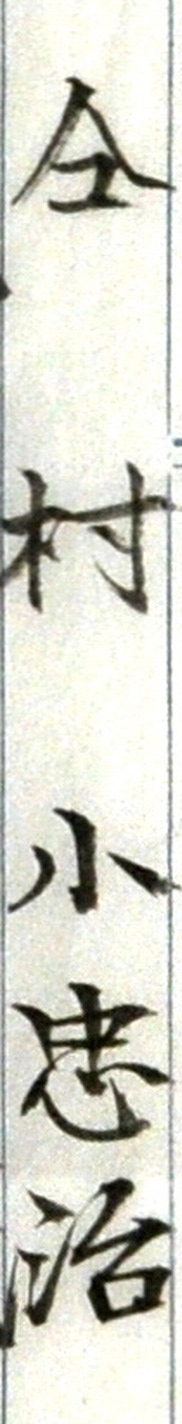同村小忠治
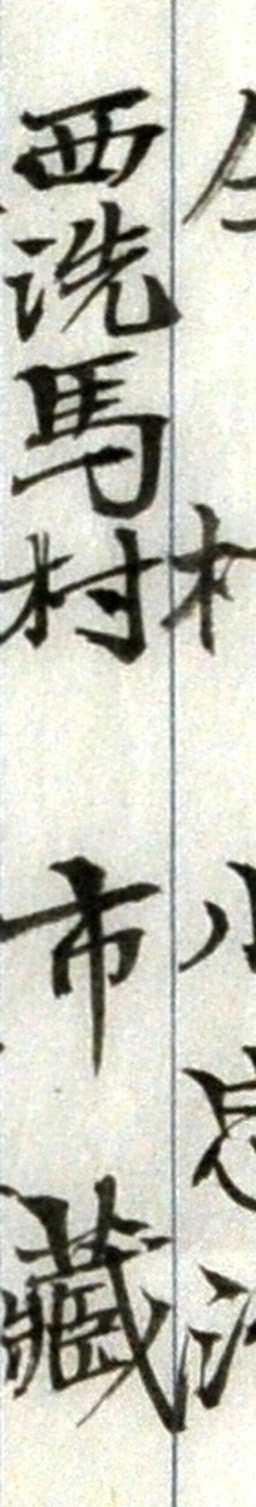西洗馬村市蔵
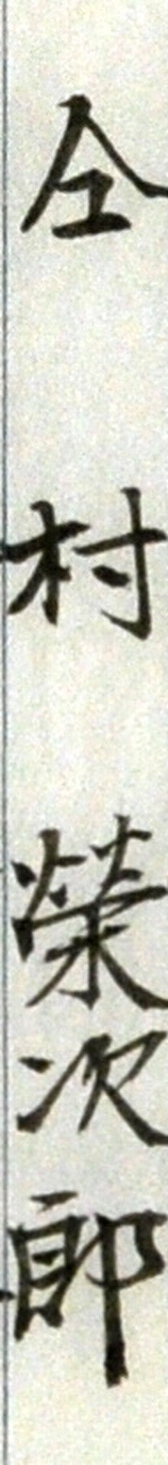同村栄次郎
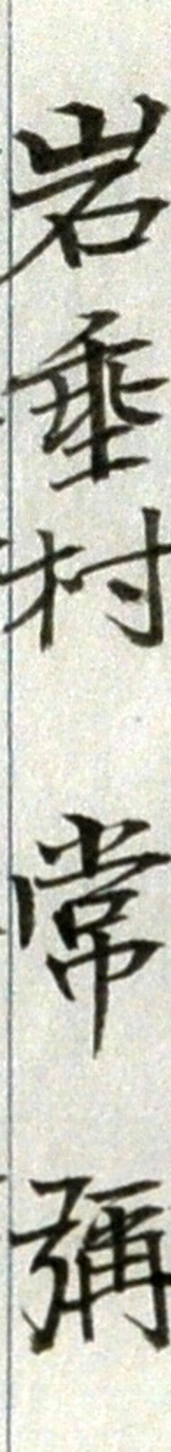岩垂村常弥
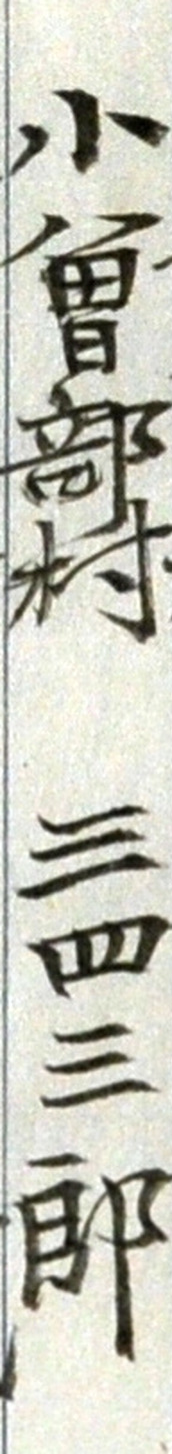小曽部村三四三郎
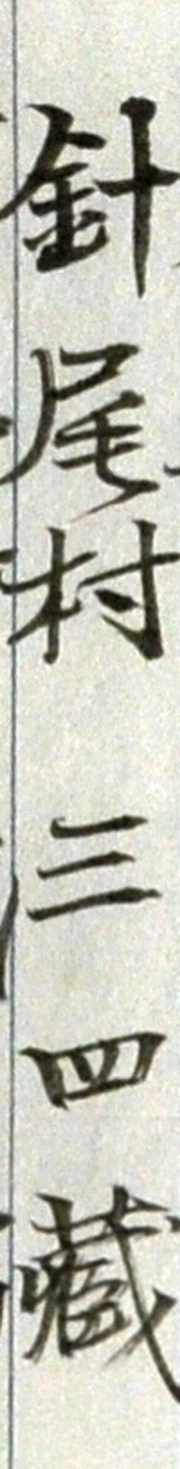針尾村三四蔵
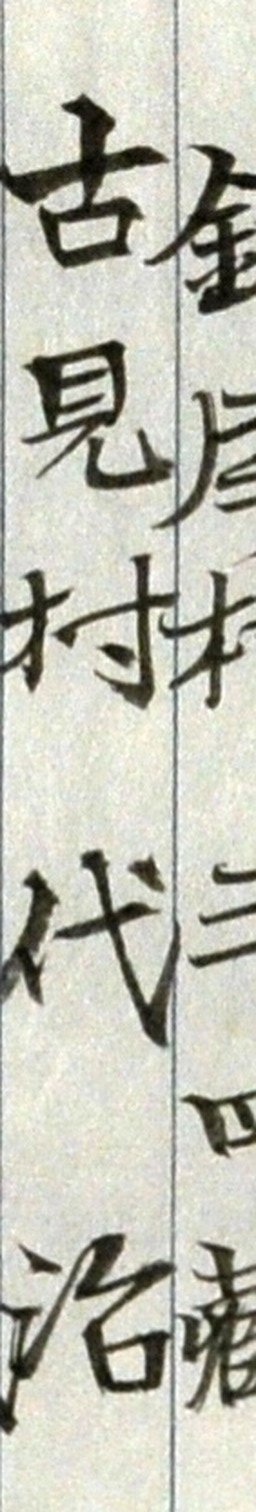古見村代治
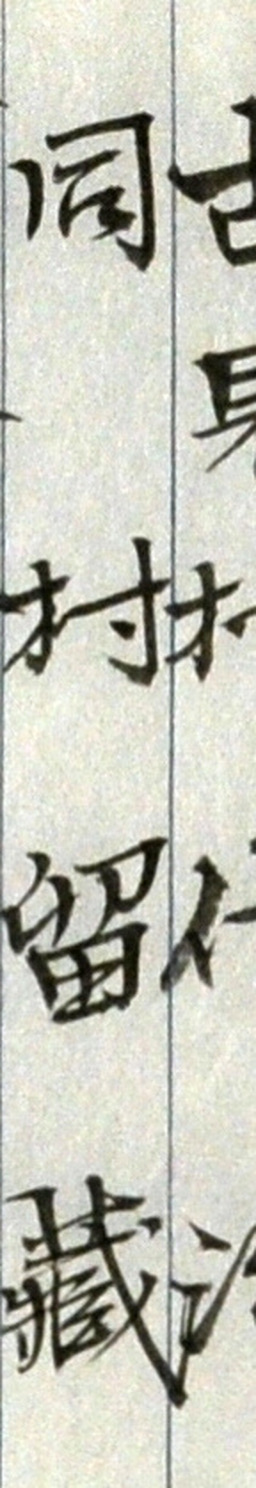同村留蔵
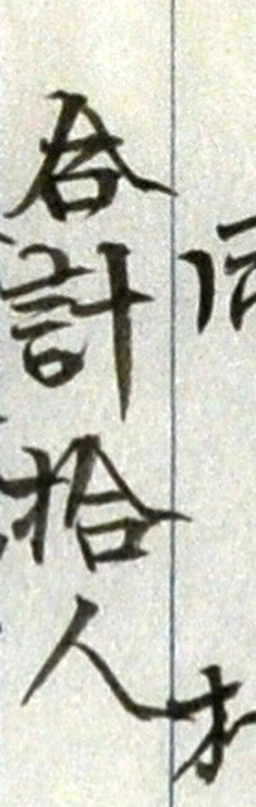合計拾人
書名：高遠藩兵員名簿歩兵銃隊・郷村募集員
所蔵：伊那市立高遠町図書館・合同会社AMANE
